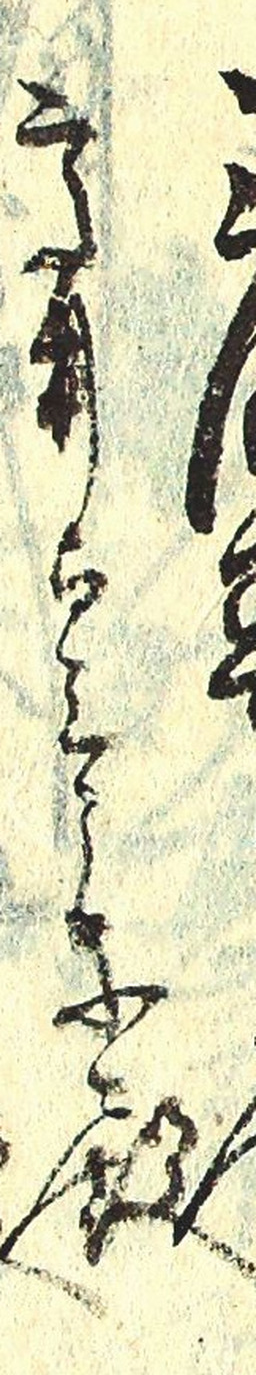高井与三兵衛殿
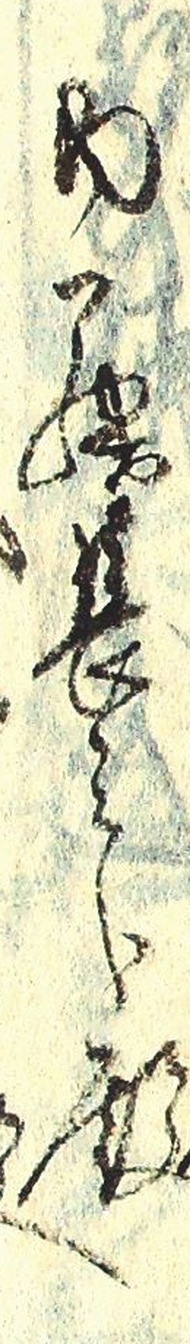内藤長三郎殿
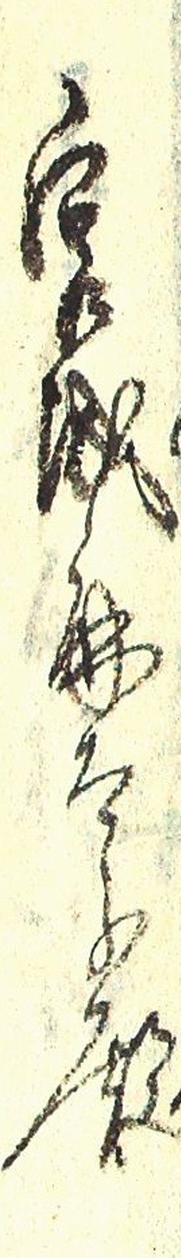宮城麻太郎殿

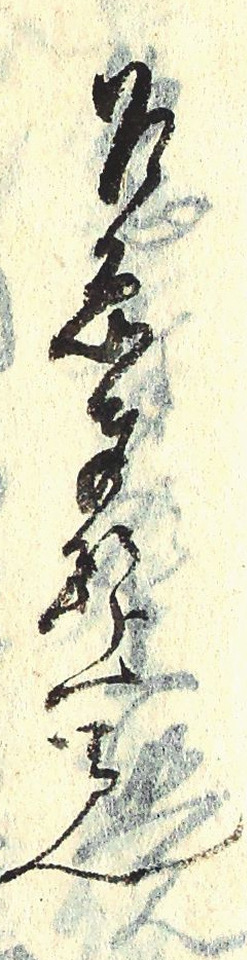乍恐奉願上覚
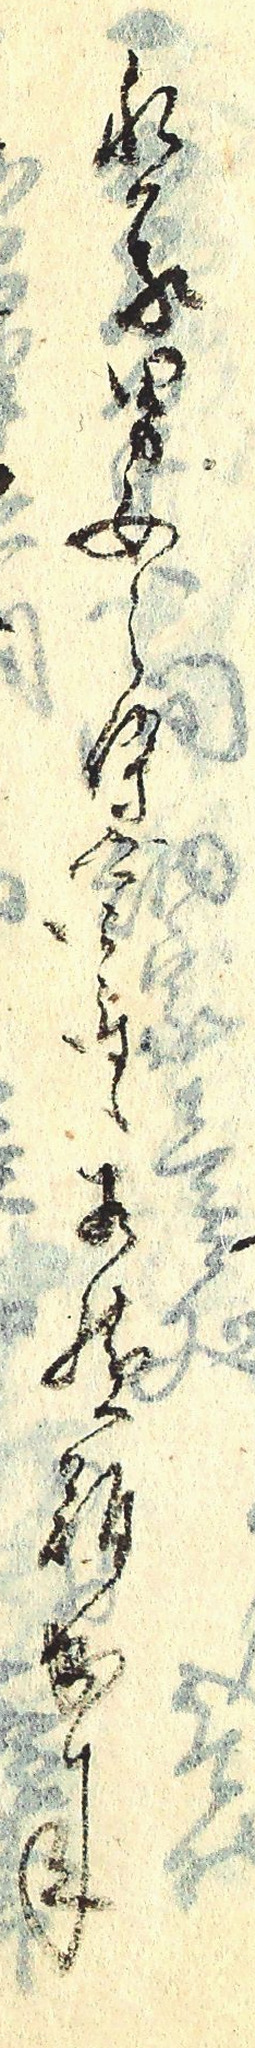私義男女之倅無御座候相続難出来
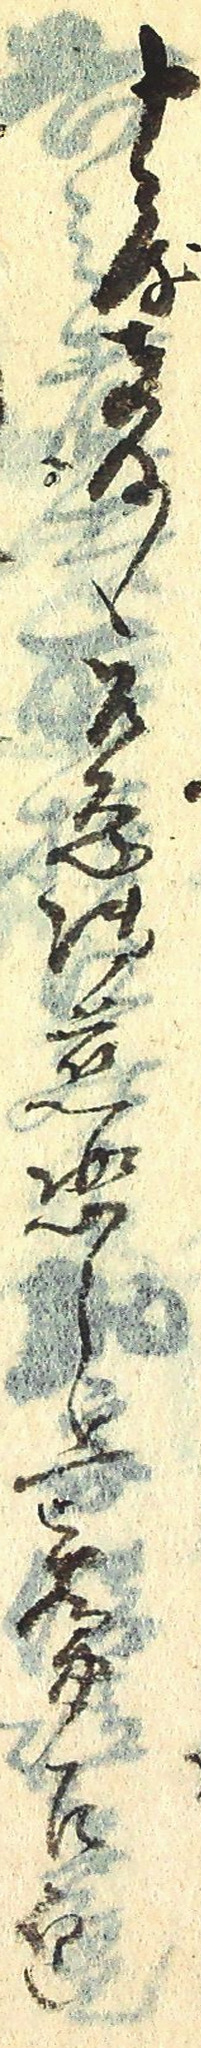申度奉存候乍恐御慈悲之上被為聞召届
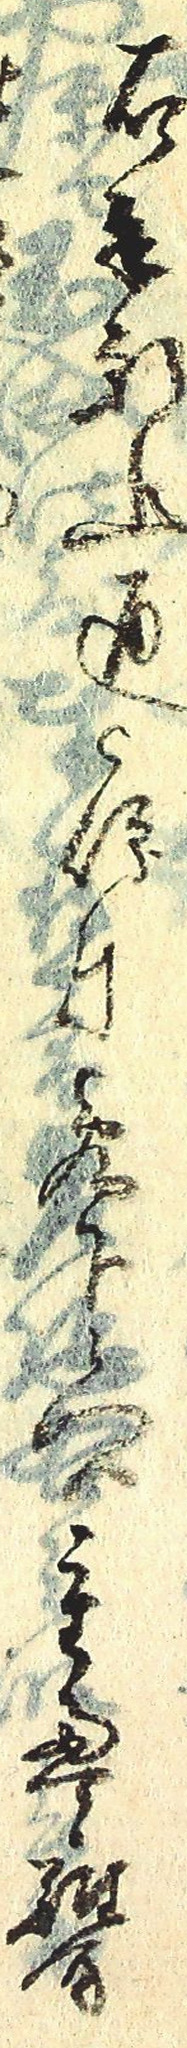右奉願上通被仰付被為下候へは重畳難有
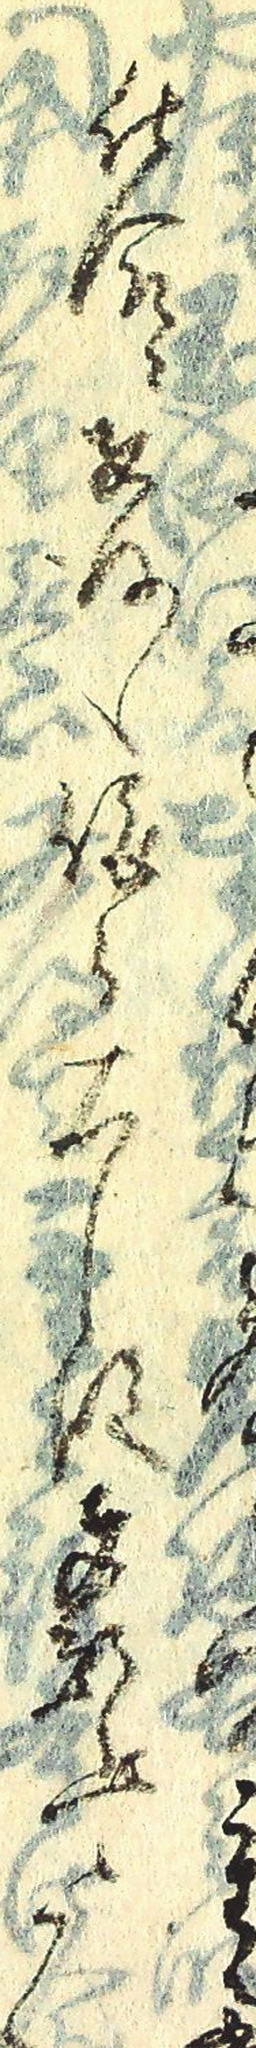仕合に奉存候依て右之段奉願上候以上
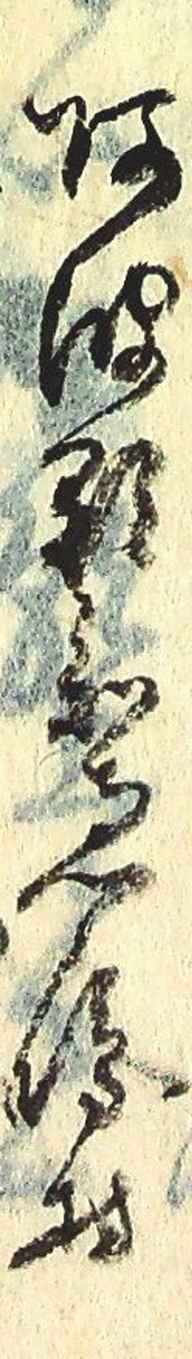阿波郡知恵島村
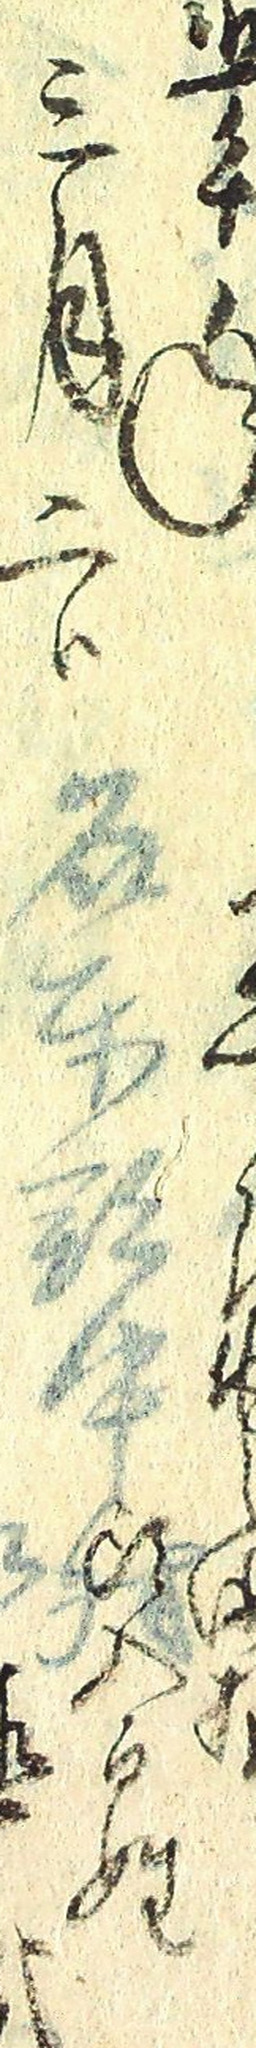三月二日頭入百姓
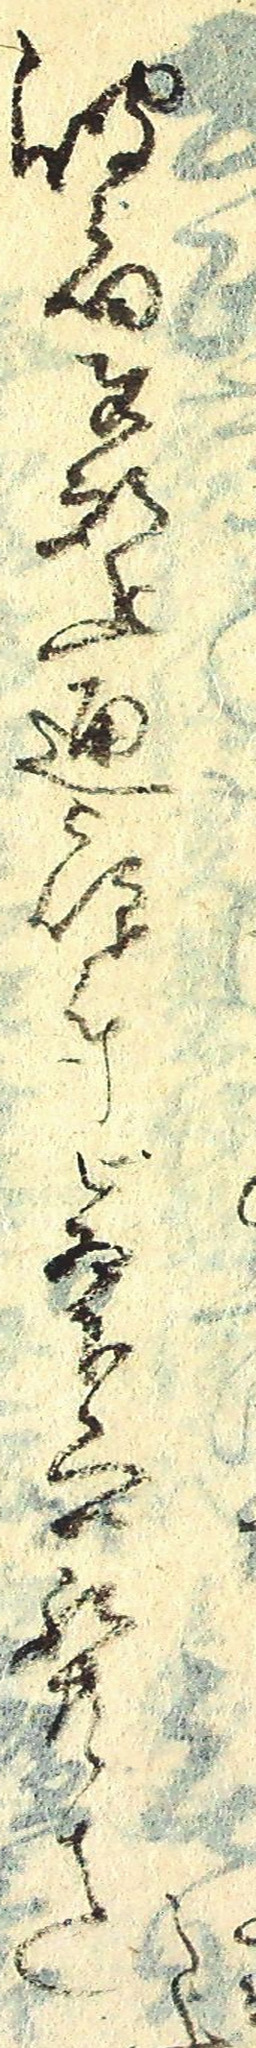彼者奉願上通被仰付被為下候へは私共迄
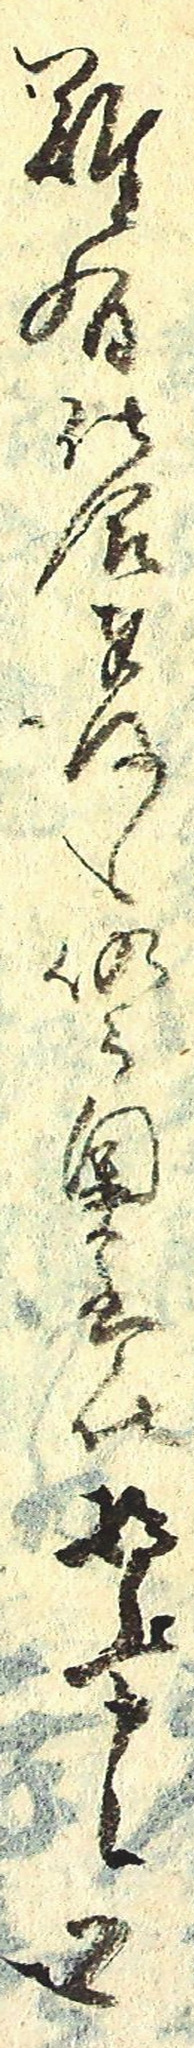難有仕合奉存候仍て奥書仕指上申候以上
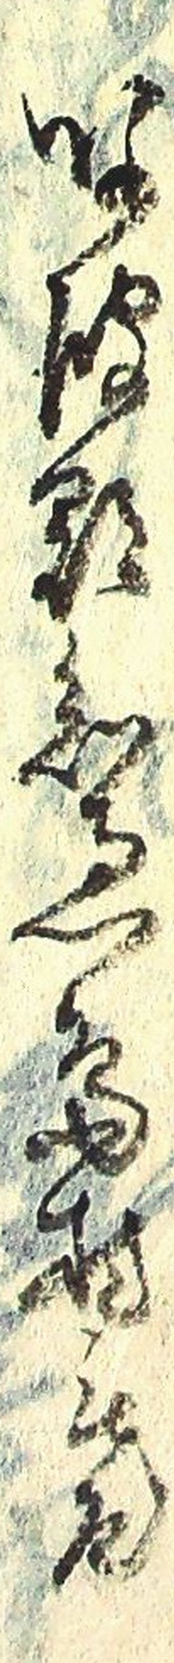阿波郡知恵島村庄屋
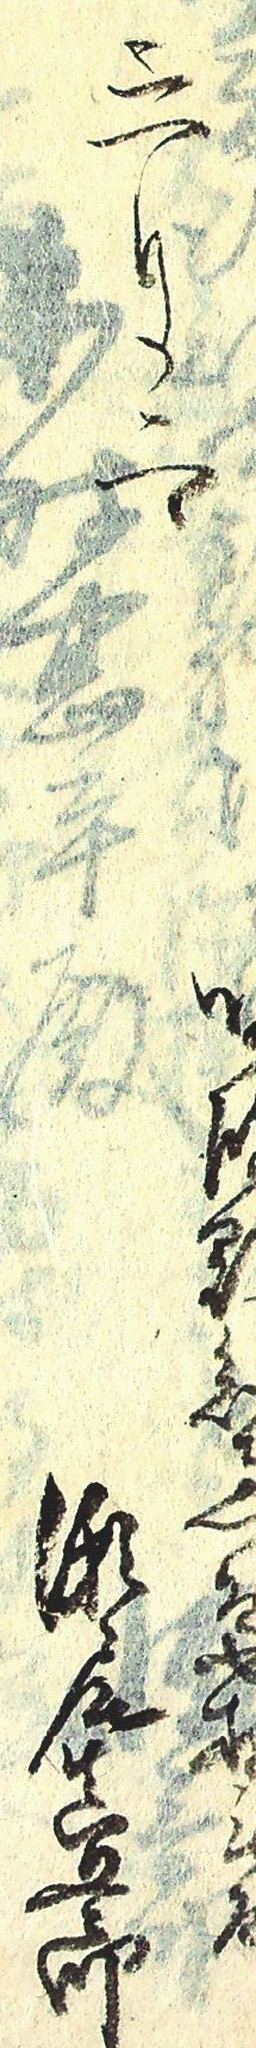三月二日瀬尾真久郎
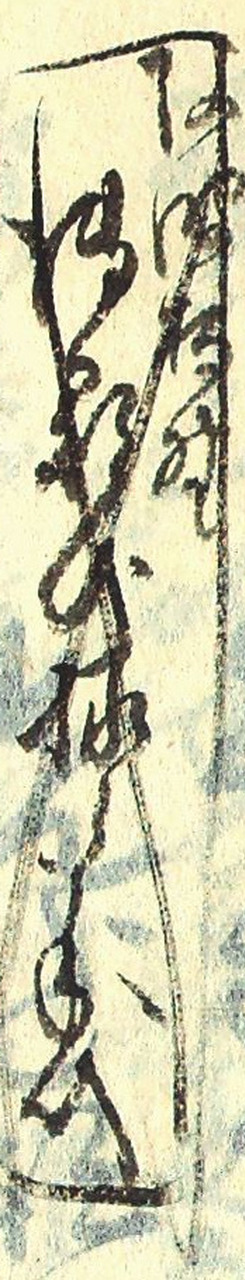御郡代様御手代
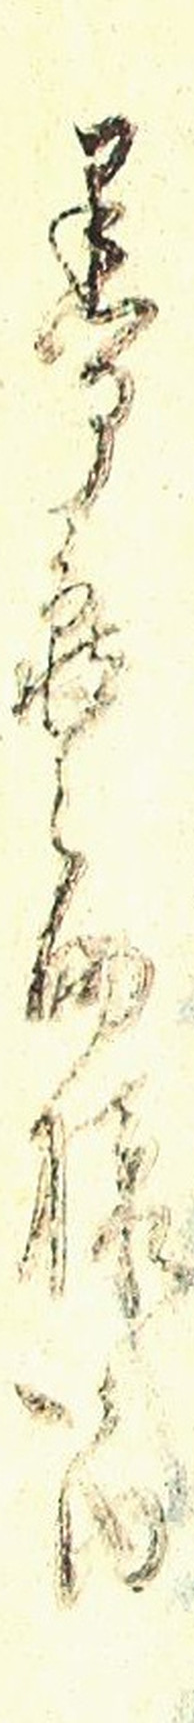黒部亀之助様御内
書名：諸御願書控(弐番）
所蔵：鳴門教育大学 Naruto University of Education
